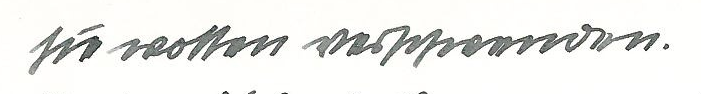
sie wollen verschwenden.
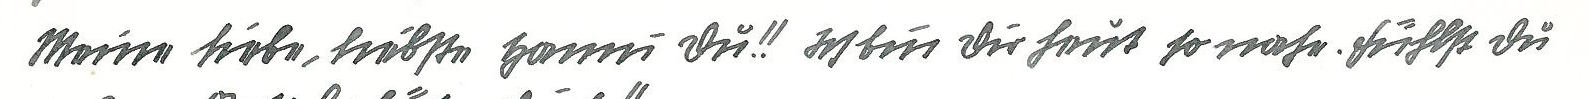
Meine liebe, liebste Du!! Ich bin Dir heut so nahe. Fühlst Du
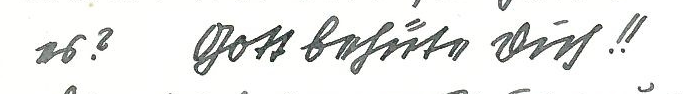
es? Gott behüte Dich!!
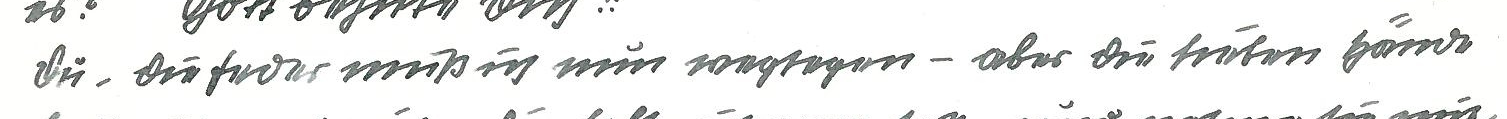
Du, die Feder muß ich nun weglegen – aber die lieben Hände
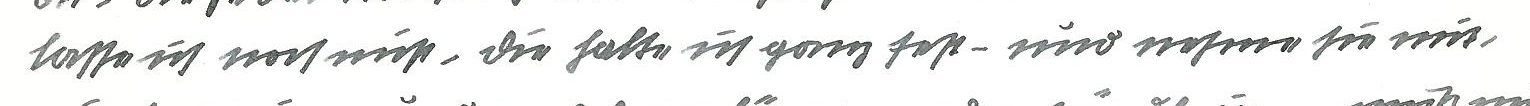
lasse ich noch nicht, die halte ich ganz fest – und nehme sie mit,
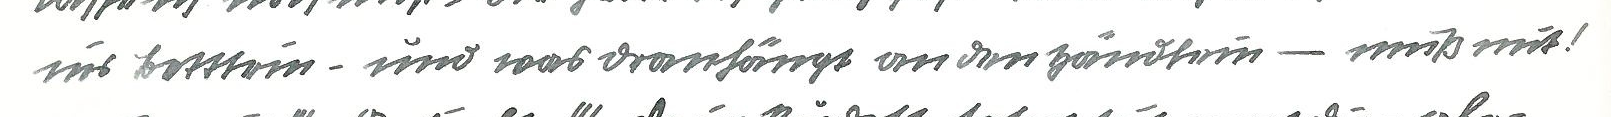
ins Bettlein – und was dran hängt an den Händlein — muß mit!
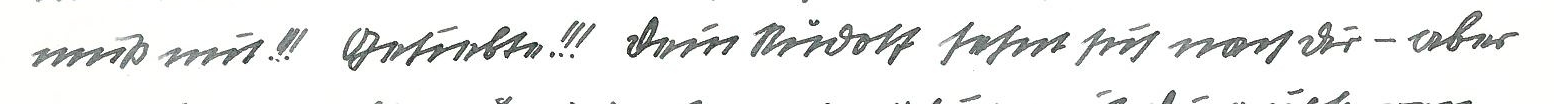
muß mit!!! Geliebte!!! Dein sehnt sich nach Dir – aber
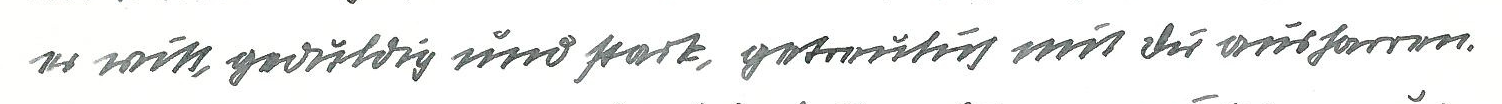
er will, geduldig und stark, getreulich mit Dir ausharren.
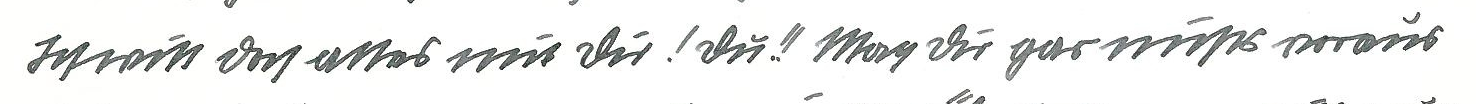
Ich will doch alles mit Dir! Du!! Mag Dir gar nichts voraus
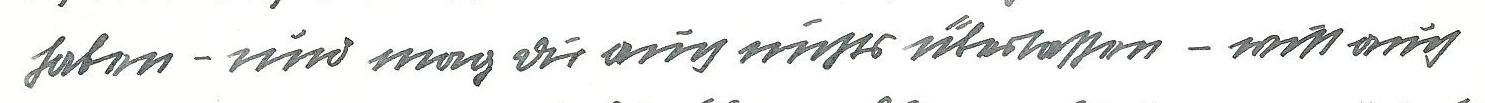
haben – und mag Dir auch nichts überlassen – will auch
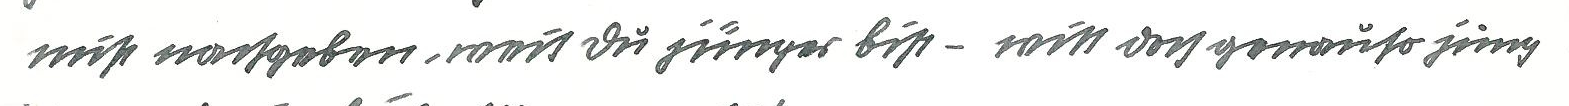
nicht nachgeben, weil Du jünger bist – will doch genauso jung
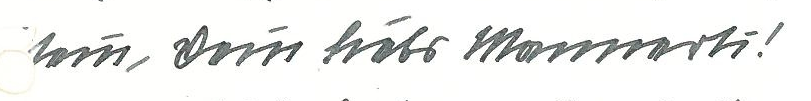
sein, Dein liebs Mannerli!
